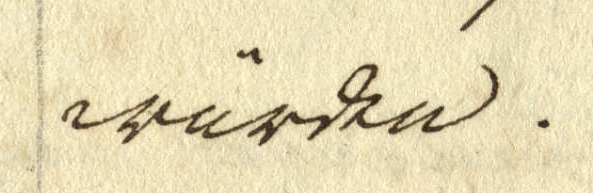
würden.
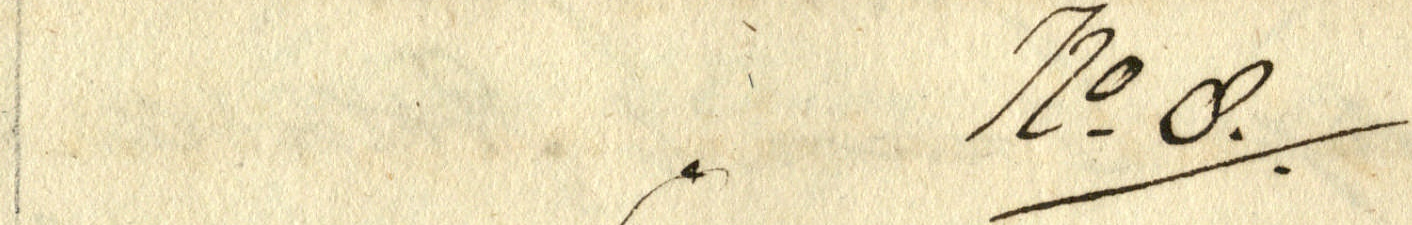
No. 8./.
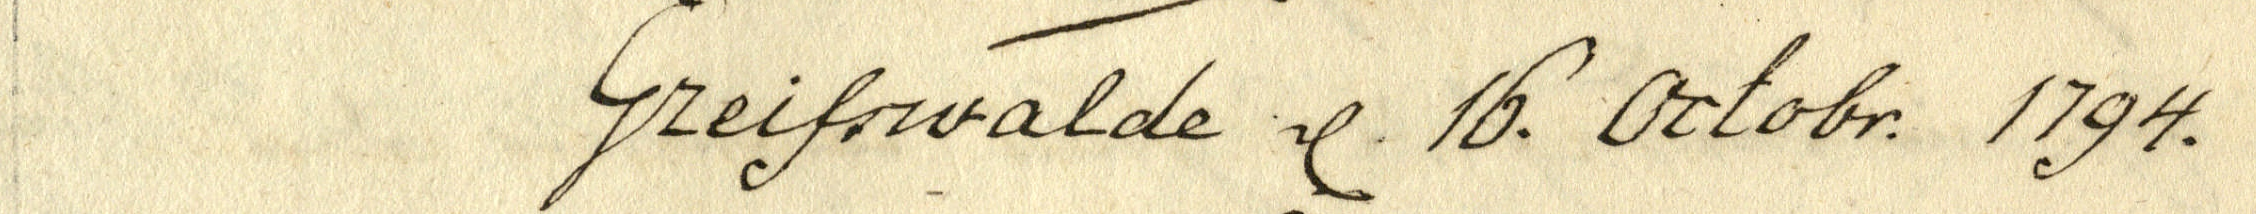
Greifswalde d. 16. Octobr. 1794.
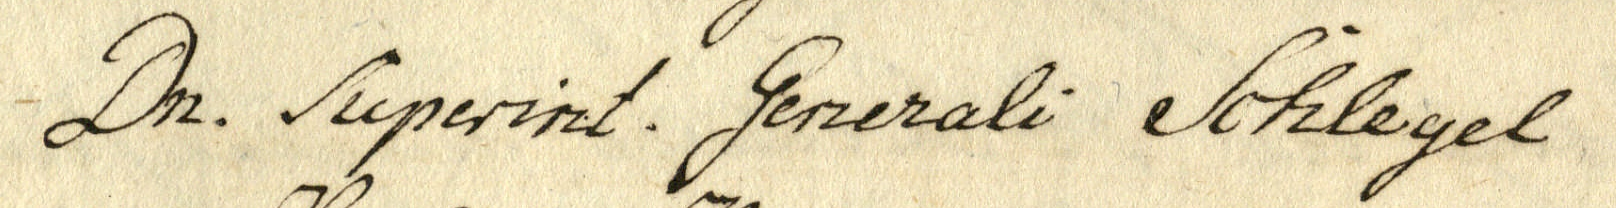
Dn. Superint. Generali Schlegel
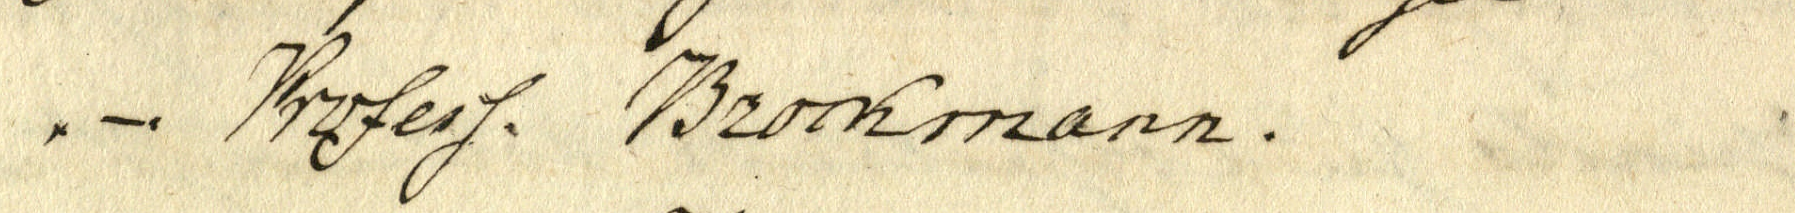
" - " Profess. Brockmann.
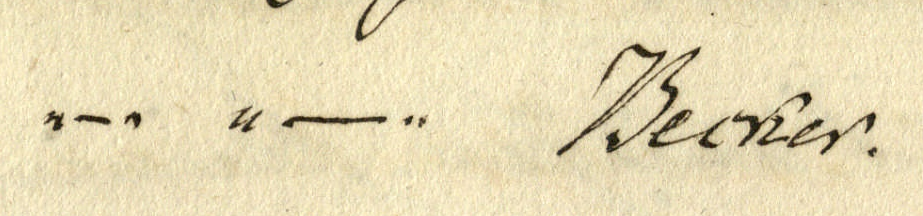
" - " " - " Becker
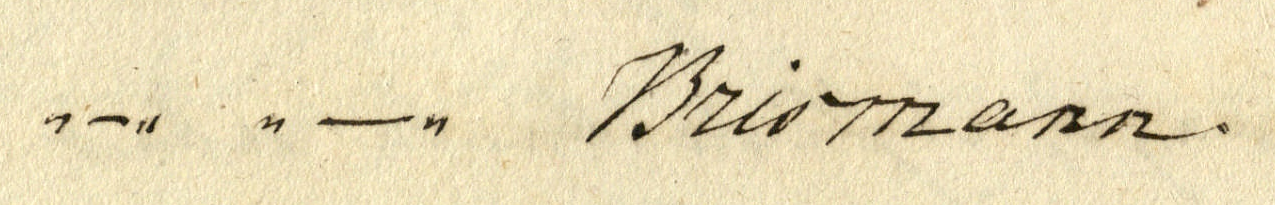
" - " " - " Brismann.
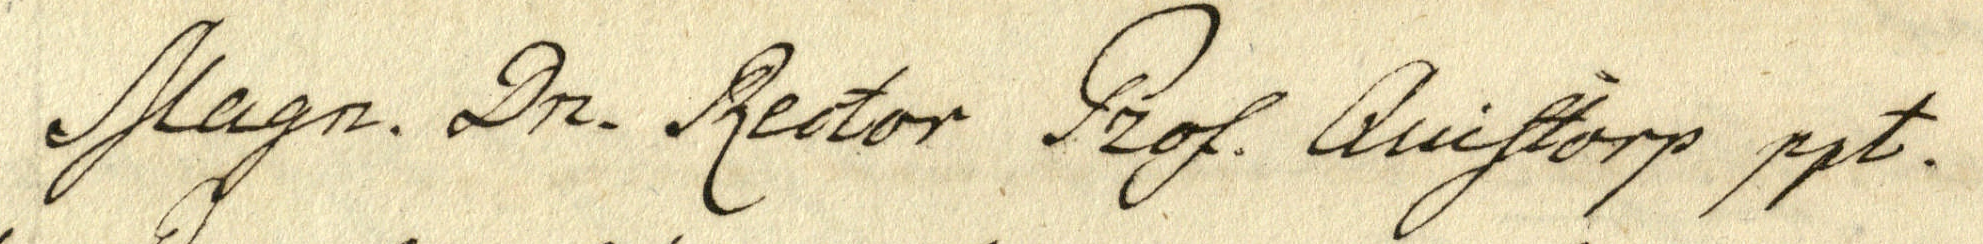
Magn. Dn. Rector Prof. Quistorp ppt.
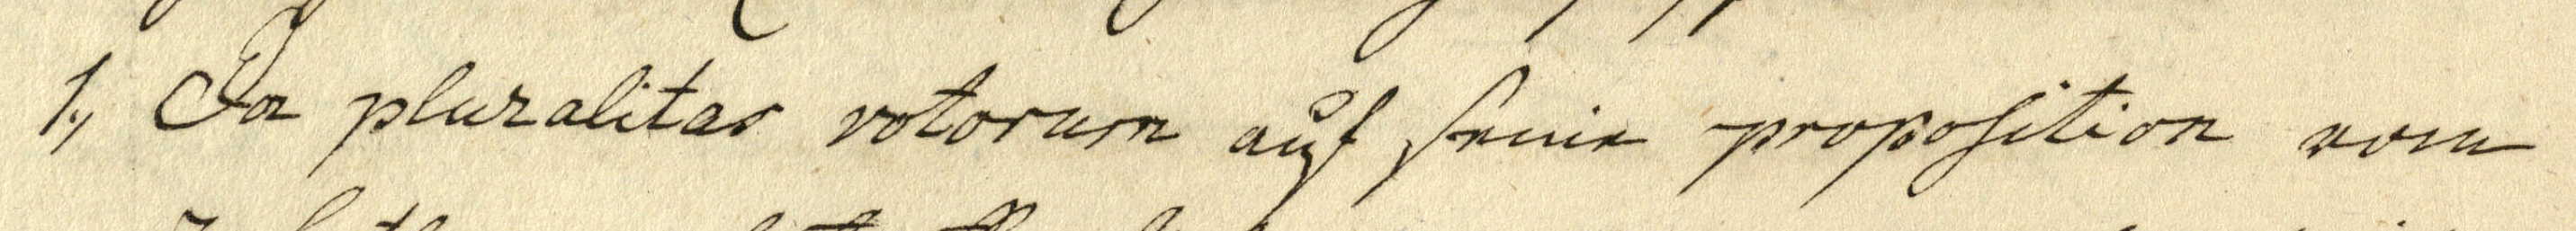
1., Da pluralitas votorum auf seine proposition vom
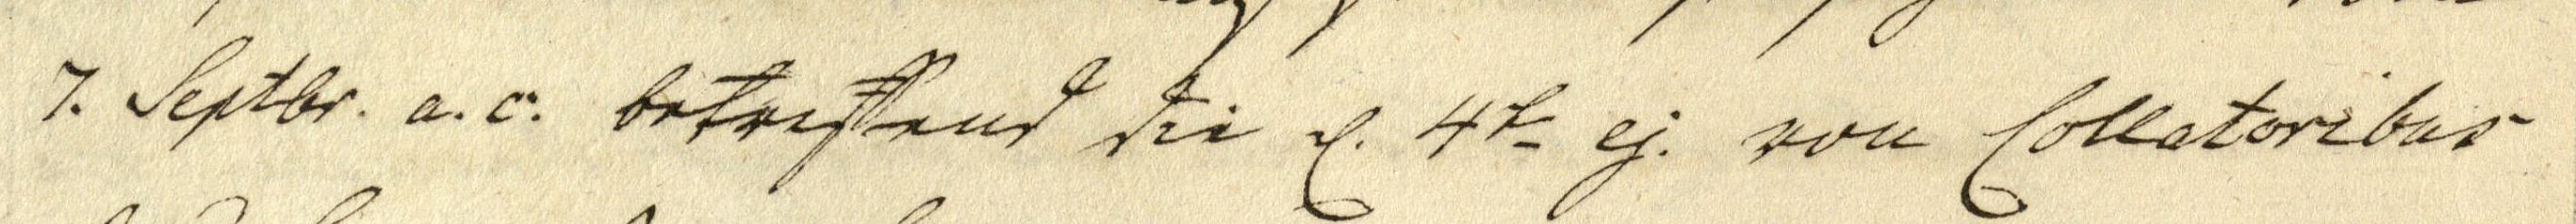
7. Septbr. a. c. betreffend d. 4ten ej. von Collatoribus
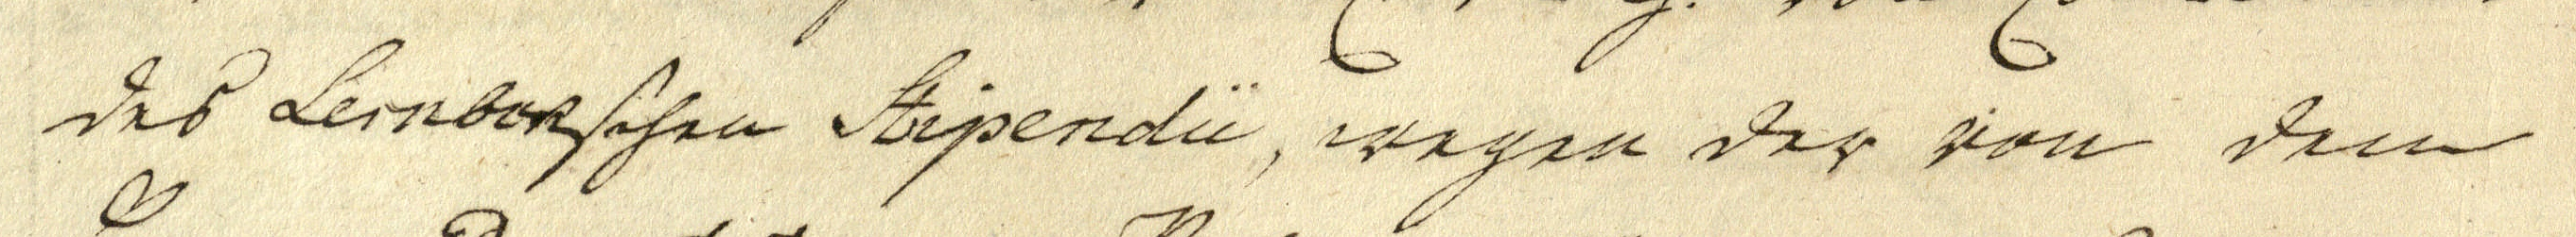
des Lembckschen Stipendii, wegen der von dem
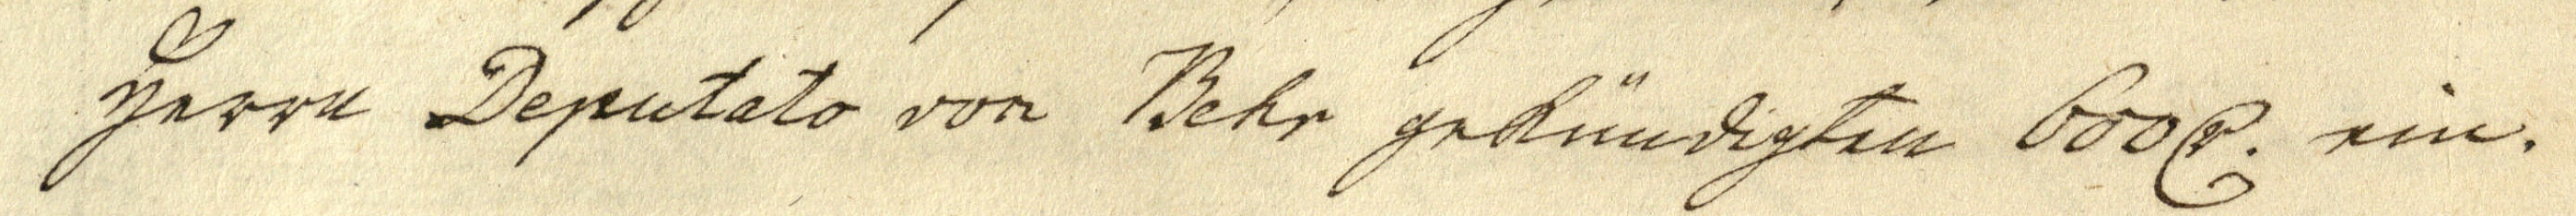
Herrn Deputato von Behr gekündigten 600 rtl ein-
